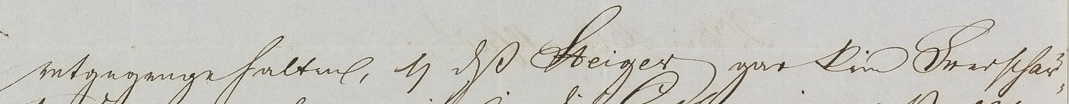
entgegengehalten, 1) dß Steiger gar kein Freischär-
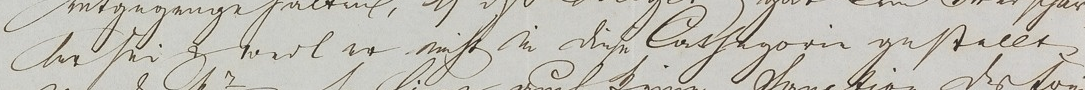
ler sei & weil er nicht in diese Cathegorie gestellt
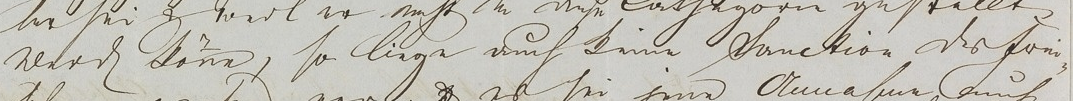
werden könne, so liege auch keine Sanction des Frei-
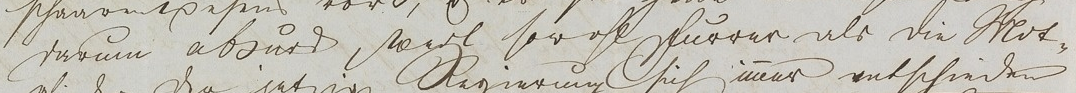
darum absurd, weil sowohl Furrer als die Mit-
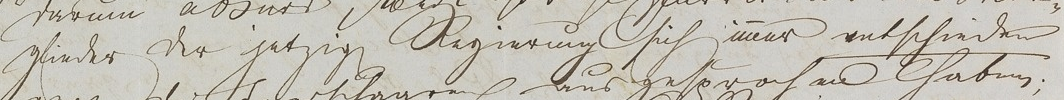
glieder der jetzigen Regierung sich immer entschieden
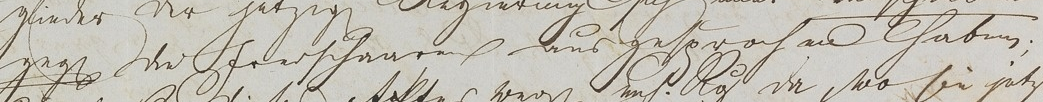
gegen die Freischaaren ausgesprochen haben;
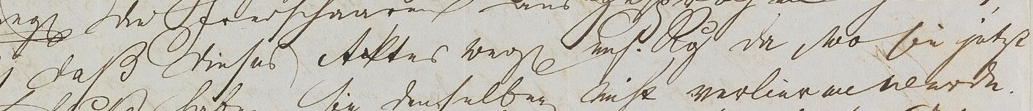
2) daß dieses Aktes wegen uns. Rg da wo sie jetzt
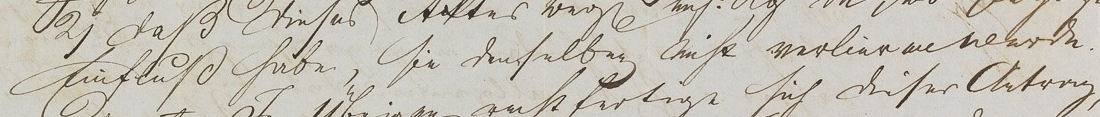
Einfluß habe, sie denselben nicht verlieren werde.
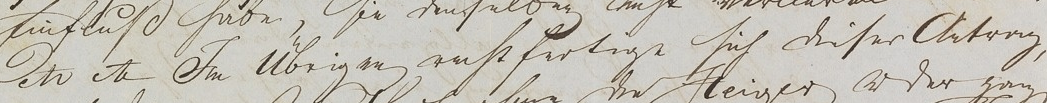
etc etc Im Übrigen rechtfertige sich dieser Antrag,
